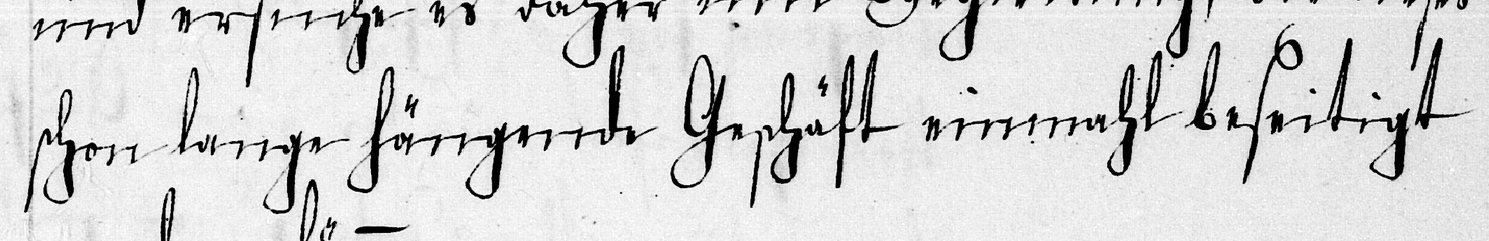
schon lange hängende Geschäft einmahl beseitigt
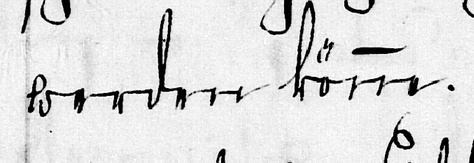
werden könne.
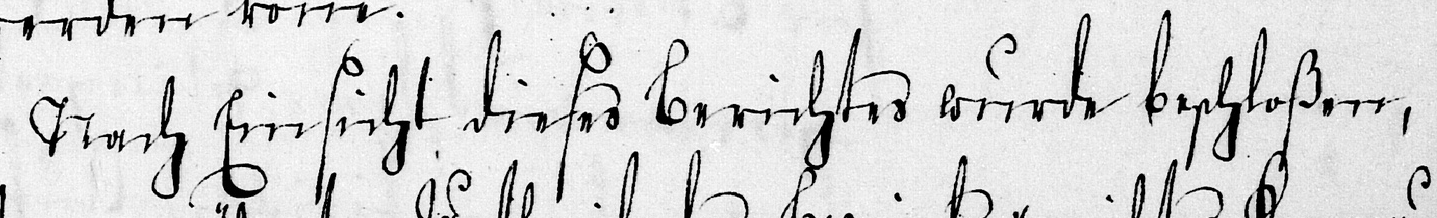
Nach Einsicht dieses Berichtes wurde beschloßen,
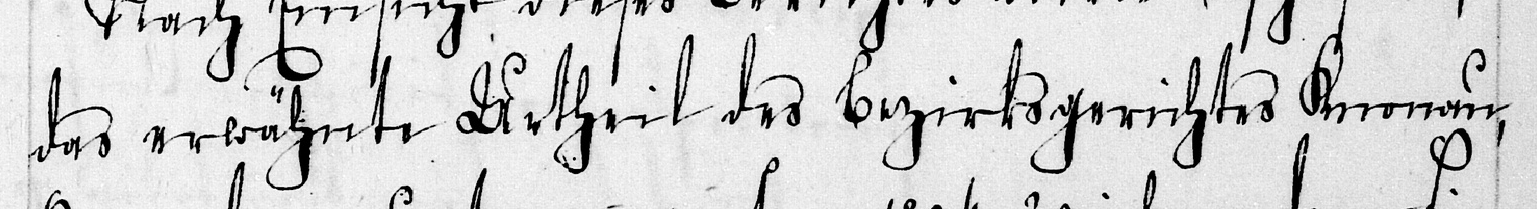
das erwähnte Urtheil des Bezirksgerichtes Knonau,
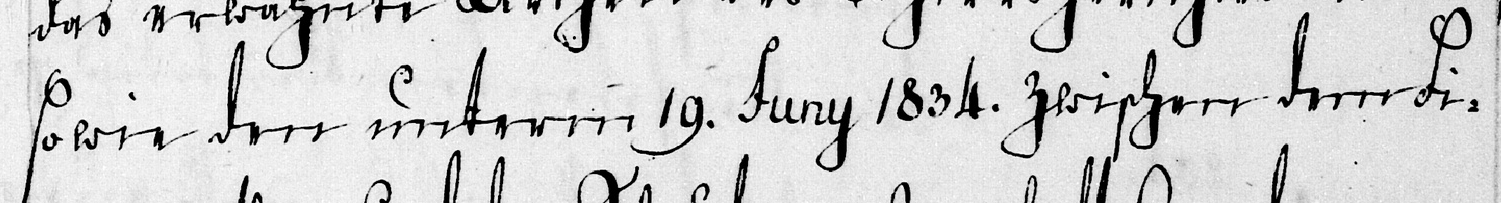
sowie den unterm 19. Juny 1834. zwischen dem Fi¬
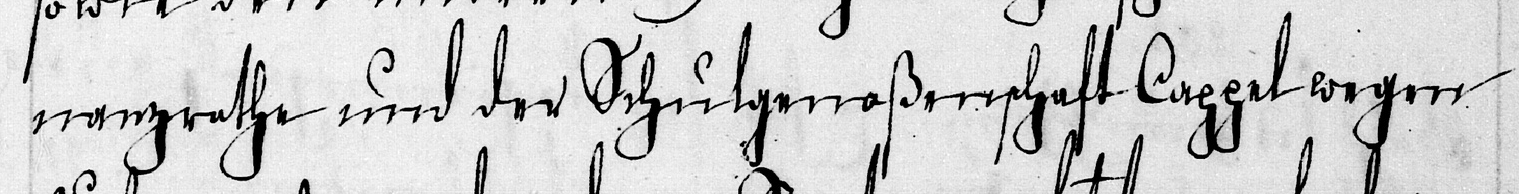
nanzrathe und der Schulgenoßenschaft Cappel wegen
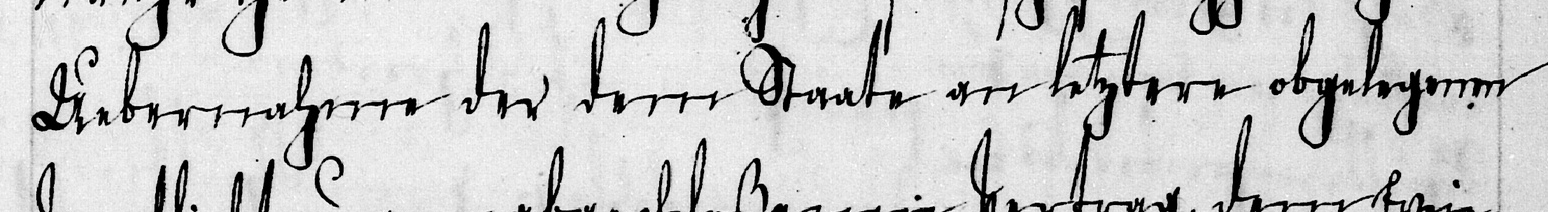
Uebernahme der dem Staate an letztere obgelegenen
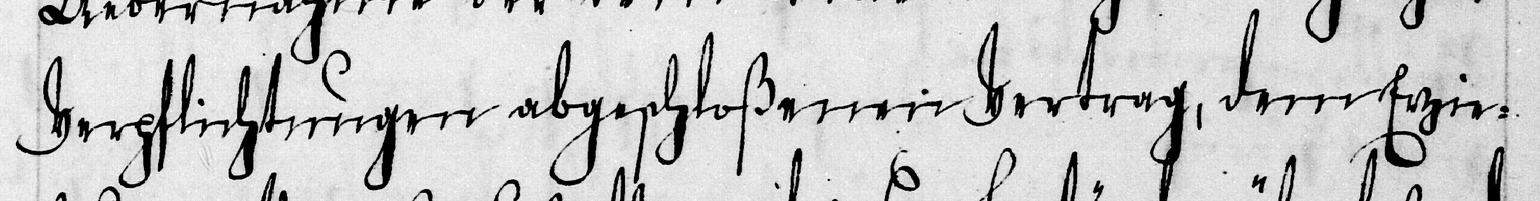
Verpflichtungen abgeschloßenen Vertrag, dem Erzie¬
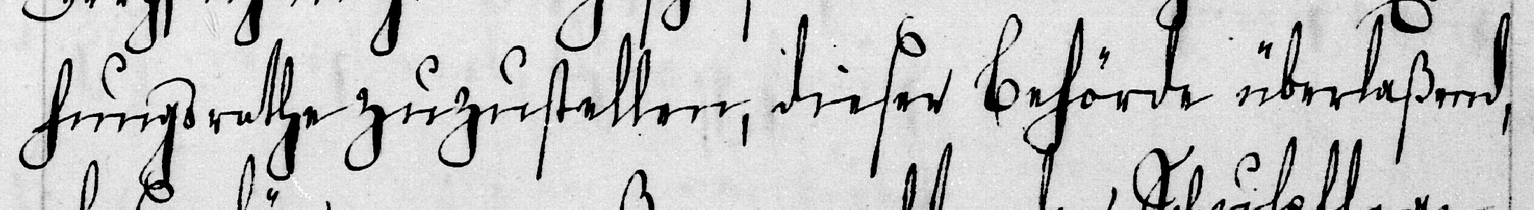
hungsrathe zuzustellen, dieser Behörde überlaßend,
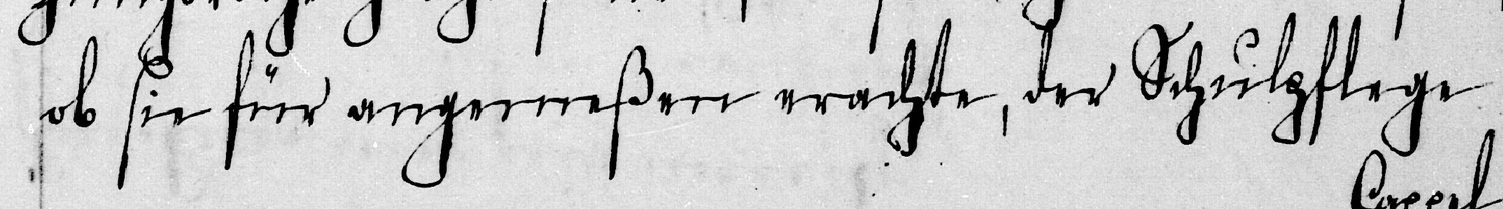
ob sie für angemeßen erachte, der Schulpflege
